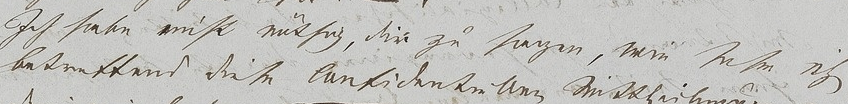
Ich habe nicht nöthig, dir zu sagen, wie sehr ich
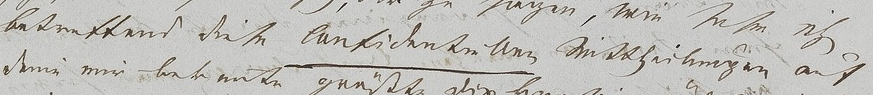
betreffend diese Confidentiellen Mittheilungen auf
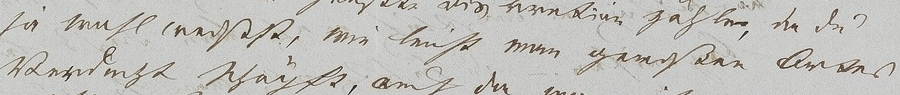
ja wohl weißst, wie leicht man gewißen Ortes
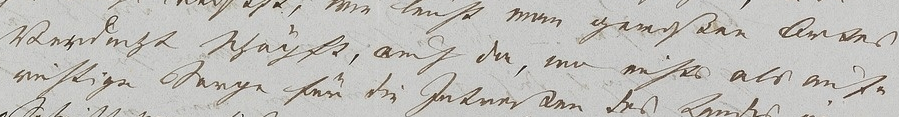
Verdacht schöpft, auch da, wo nichts als auf-
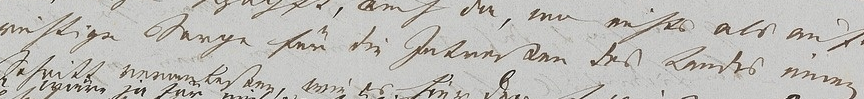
richtige Sorge für die Intreßen des Landes einen
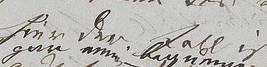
hier der Fall ist. –
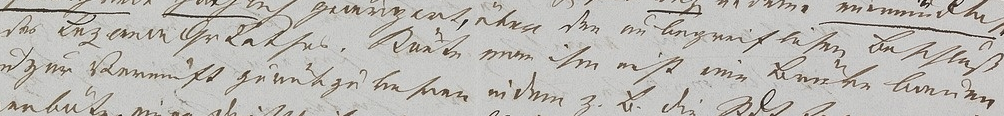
des Luzerner Gr Rathes. Könnte man ihm nicht eine Brüke bauen
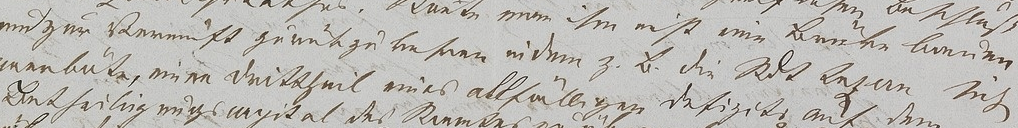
um zur Vernunft zurükzukehren indem z. B. die Stdt Luzern sich
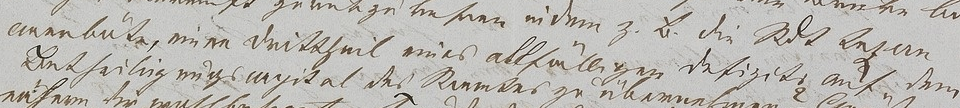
anerböte, einen Drittheil eines allfälligen Defizits auf dem
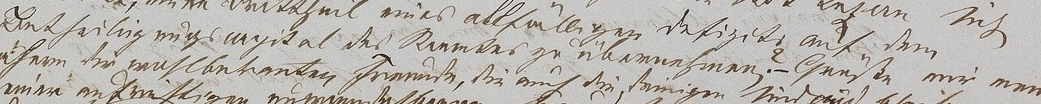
Betheiligungscapital des Staates zu übernehmen? – Grüße mir meine
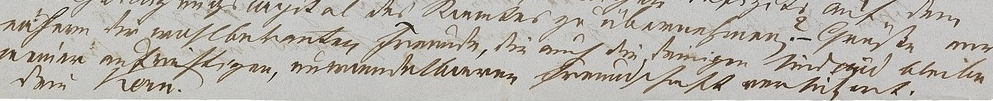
nähern dir wohlbekannten Freunde, die auch die deinigen sind und bleibe
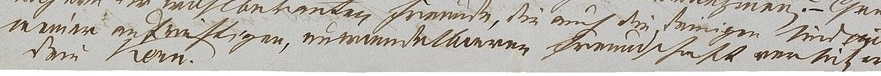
meiner aufrichtigen, unwandelbaren Freundschaft versichert.
